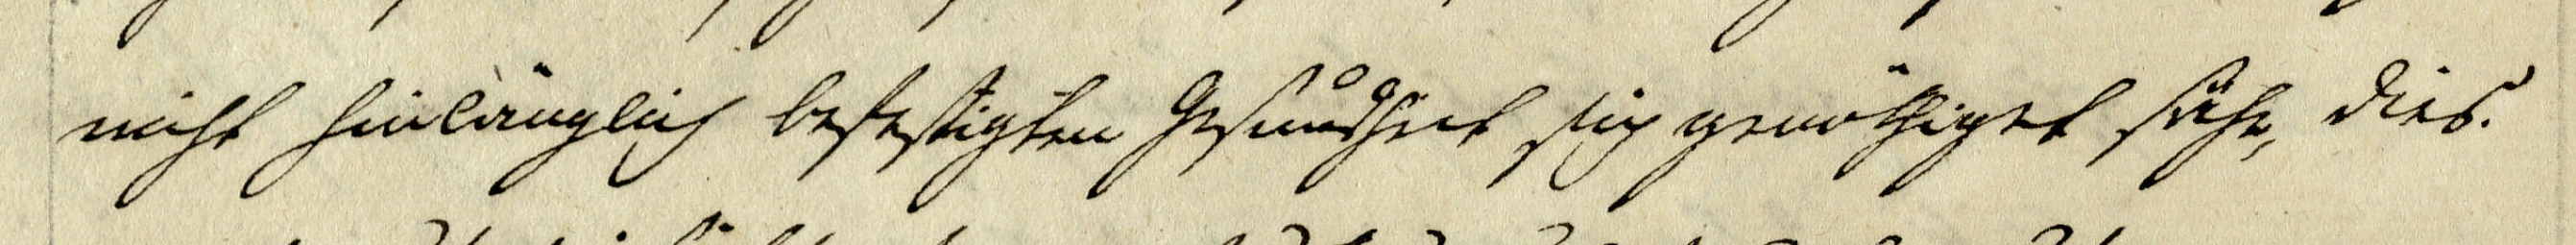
nicht hinlänglich befestigten Gesundheit sich genöthiget sähe, dies¬
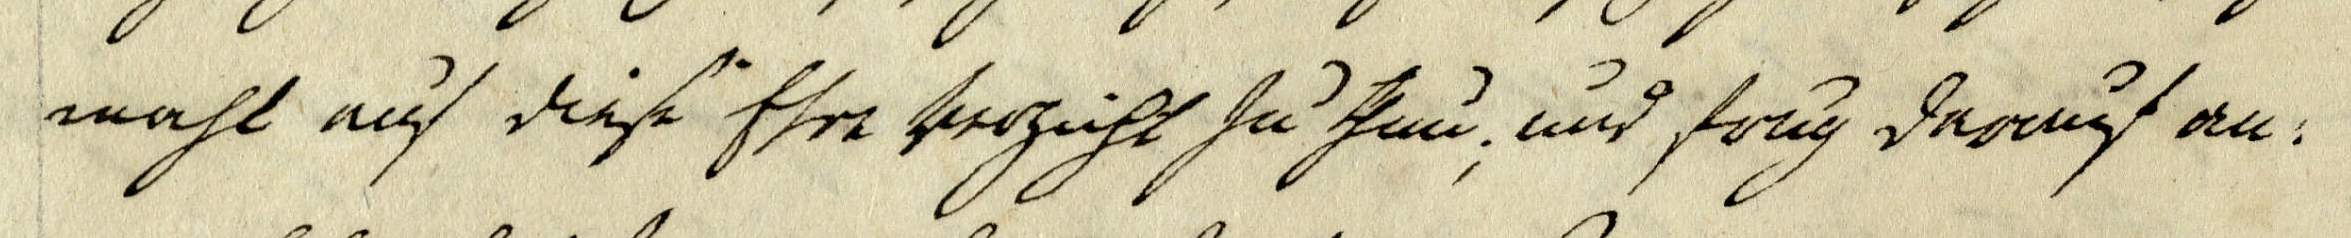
mahl auf diese Ehre Verzicht zu thun; und frug darauf an:
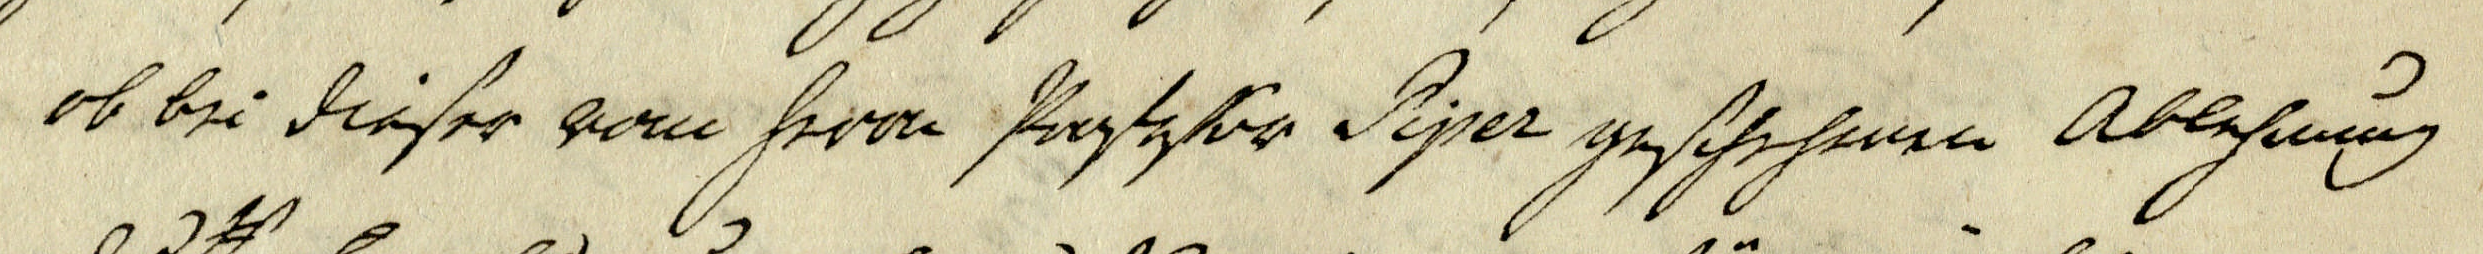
ob bei dieser vom Herrn Professor Piper geschehenen Ablehnung
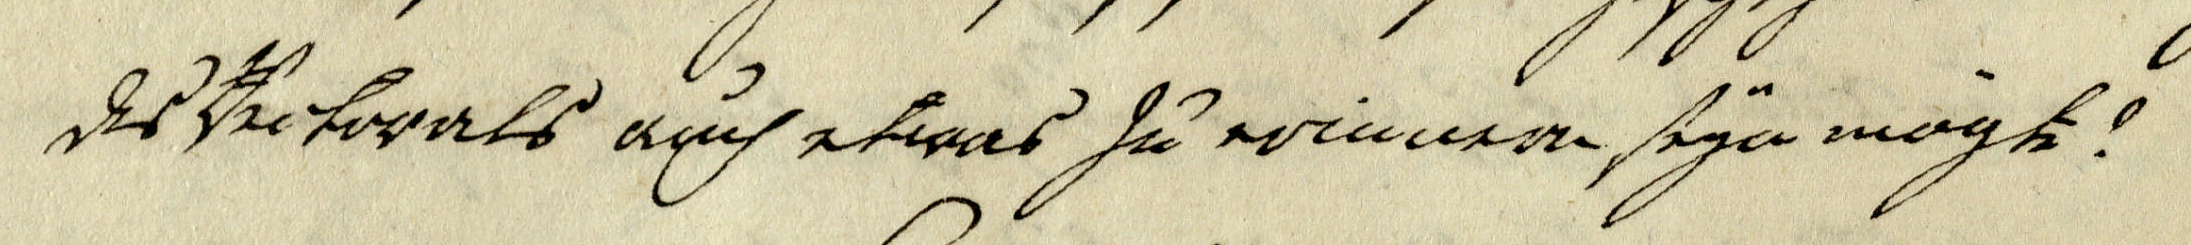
des Rectorats auch etwas zu erinnern seÿn mögte?
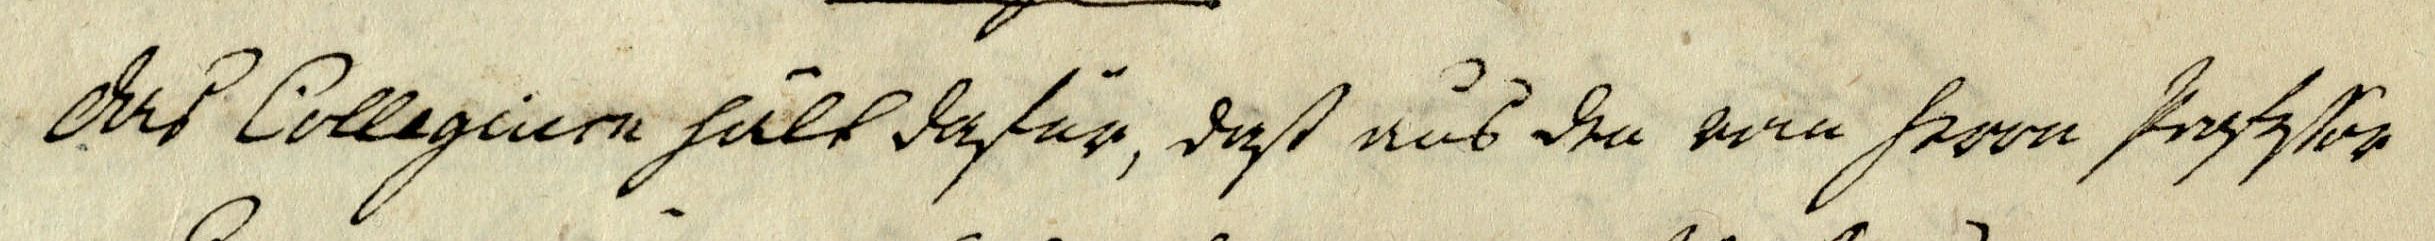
Das Collegium hält dafür, daß aus den vom Herrn Professor
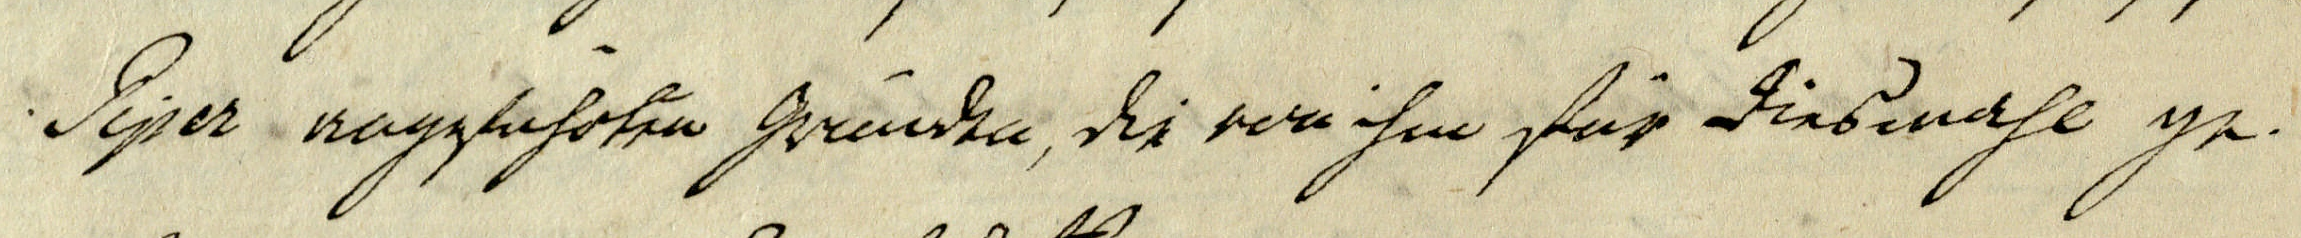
Piper angeführten Gründen, die von ihm für diesmahl ge¬
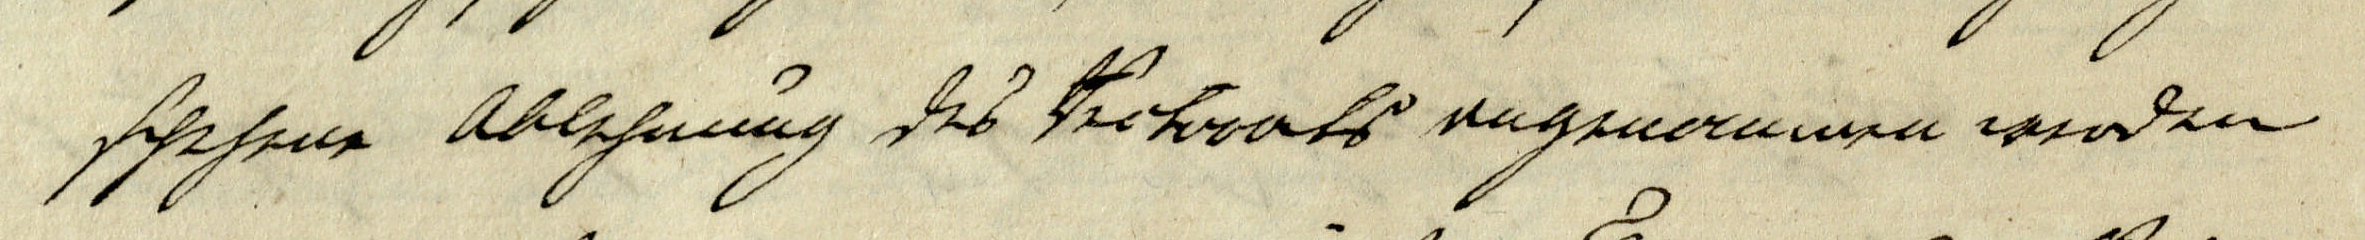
schehene Ablehnung des Rectorats angenommen werden
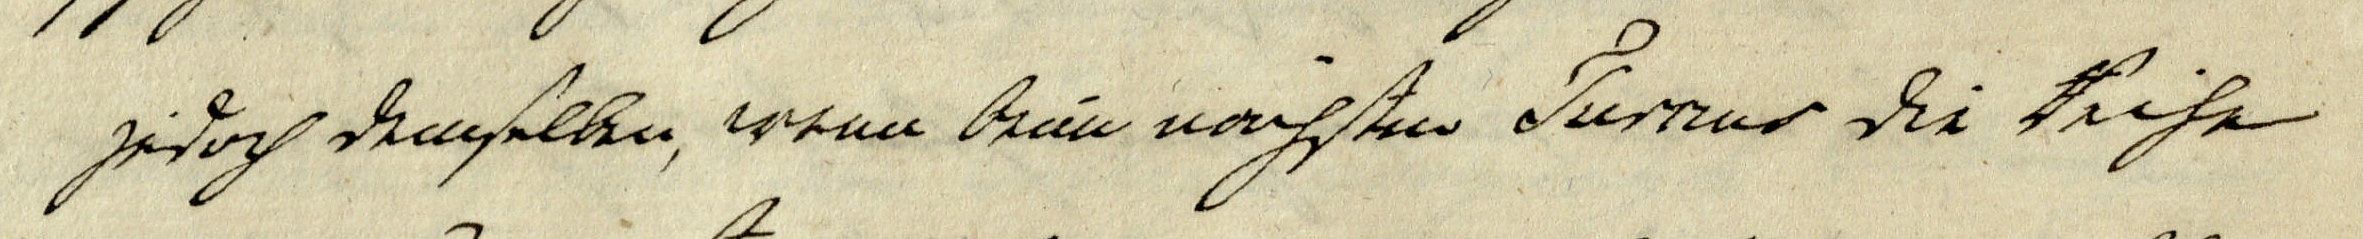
jedoch demselben, wenn beim nächsten Turnus die Reihe
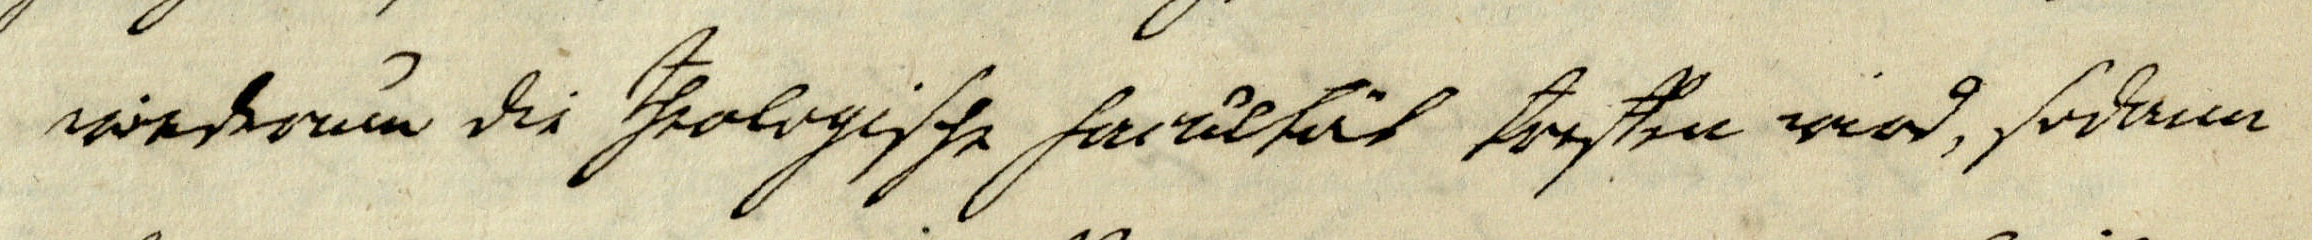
wiederum die Theologische Facultät treffen wird, sodann
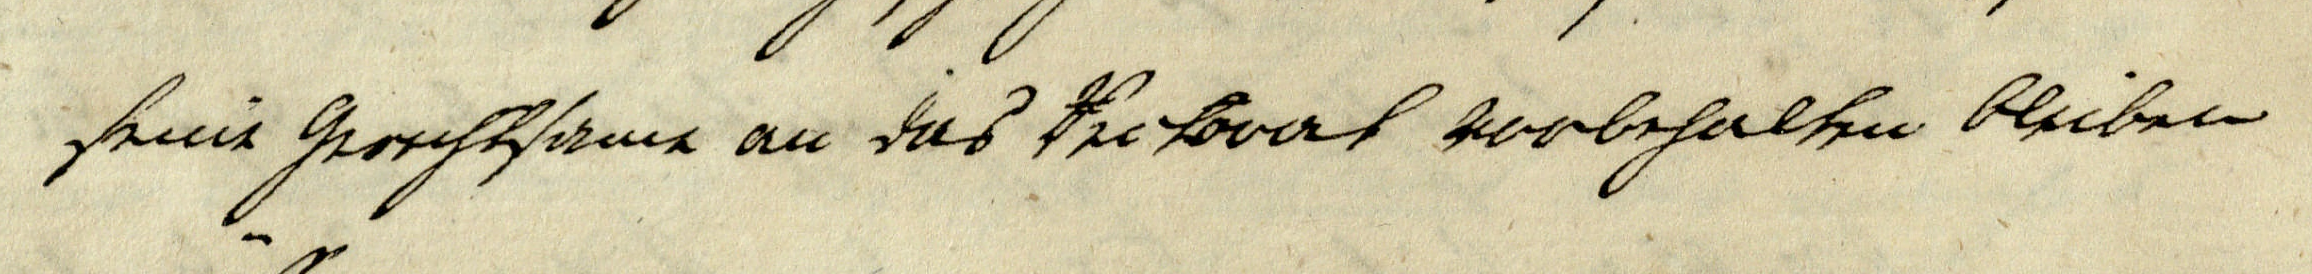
seine Gerechtsame an das Rectorat vorbehalten bleiben
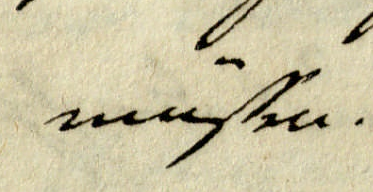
müssen.
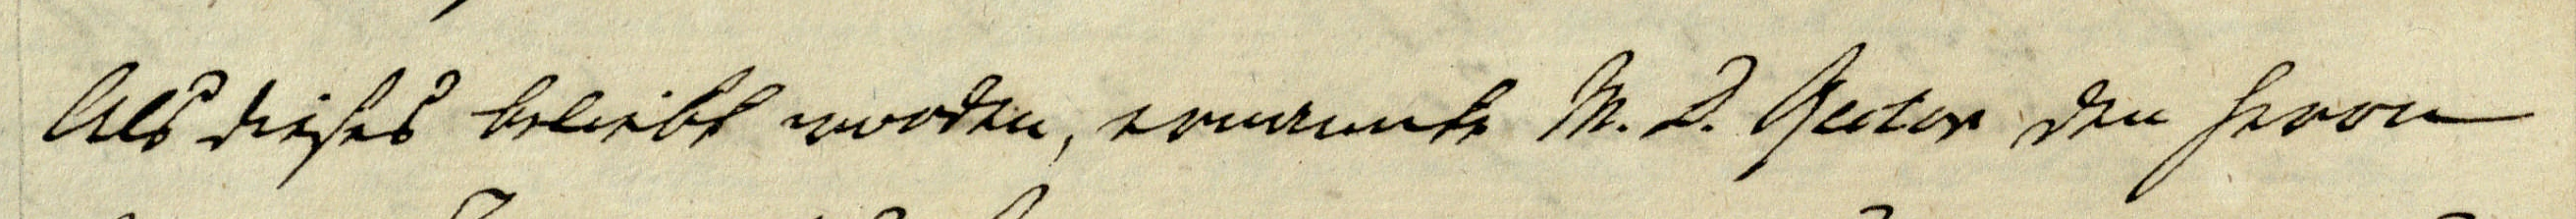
Als dieses beliebt worden, ernannte M. D. Rector den Herrn
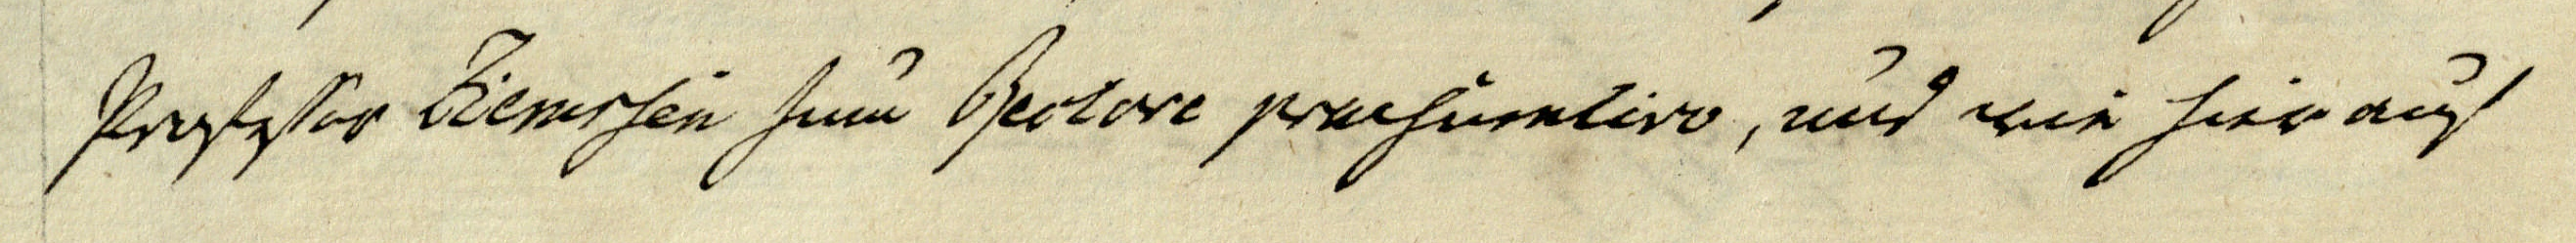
Professor Ziemssen zum Rectore praesumtivo, und wie hierauf
